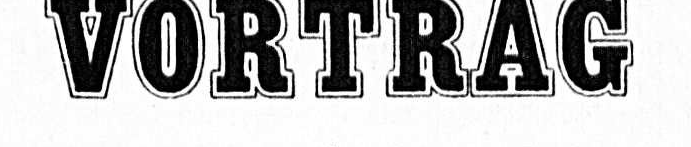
Vortrag
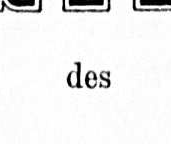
des
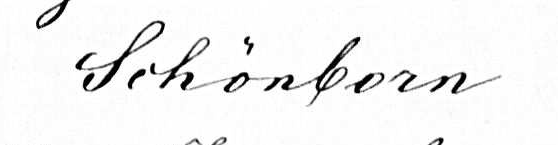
Schönborn
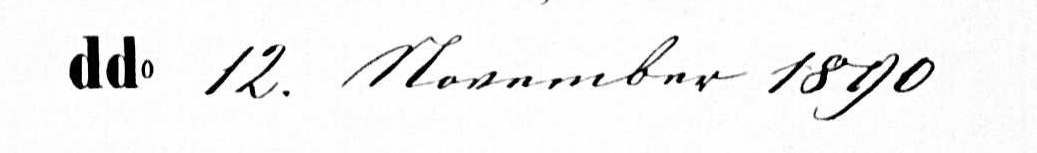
ddo. 12. November 1890
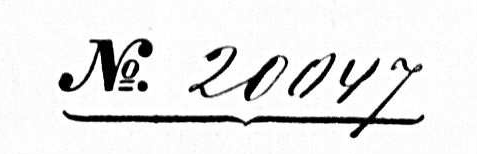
No. 20047
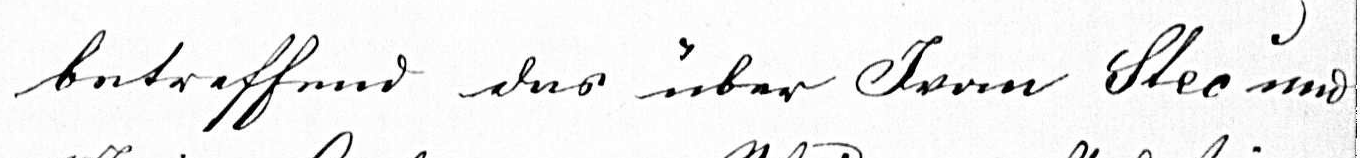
betreffend das über Ivan Stec und
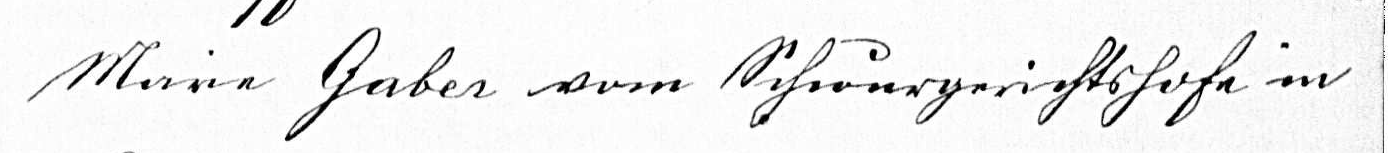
Marie Gaber vom Schwurgerichtshofe in
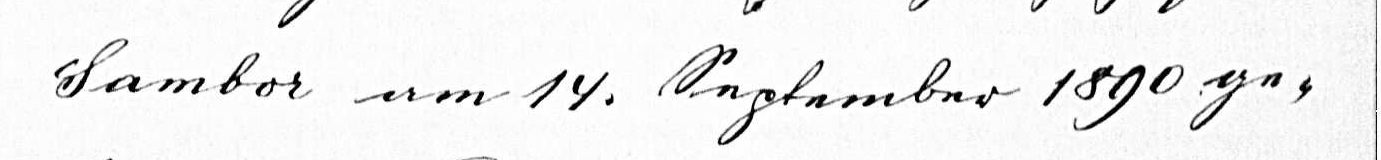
Sambor am 14. September 1890 ge¬
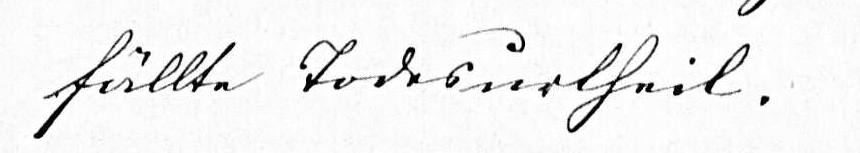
fällte Todesurtheil.
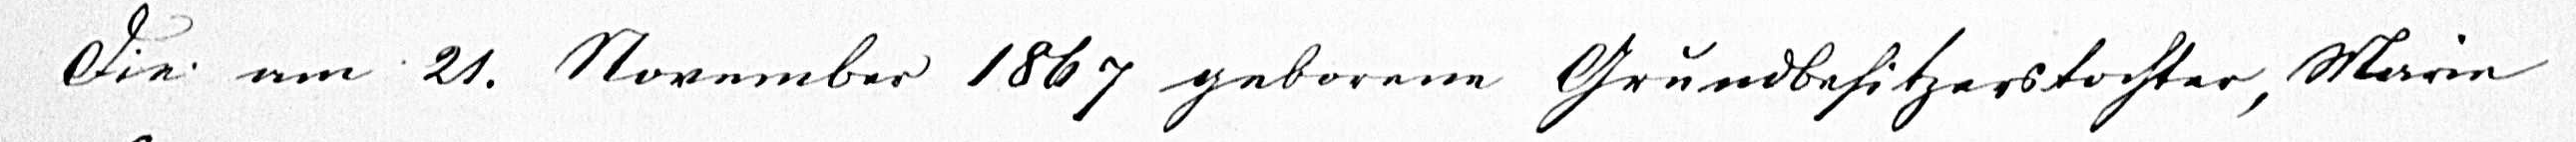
Die am 21. November 1867 geborene Grundbesitzerstochter, Marie
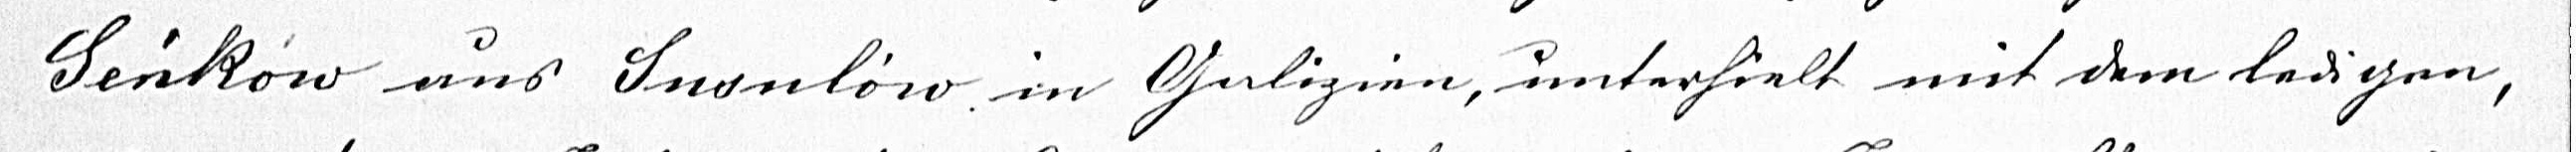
Seńków aus Susxxlów in Galizien, unterhielt mit dem ledigen,
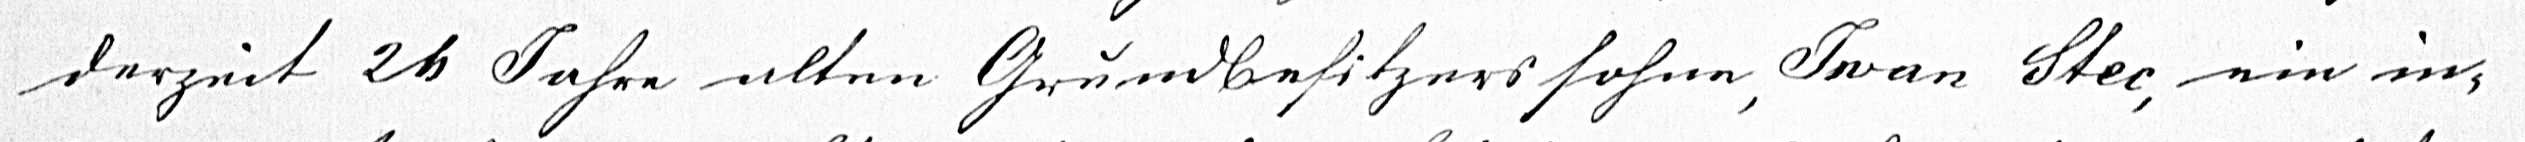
derzeit 26 Jahre alten Grundbesitzers xx, Jwan Stec, ein in¬
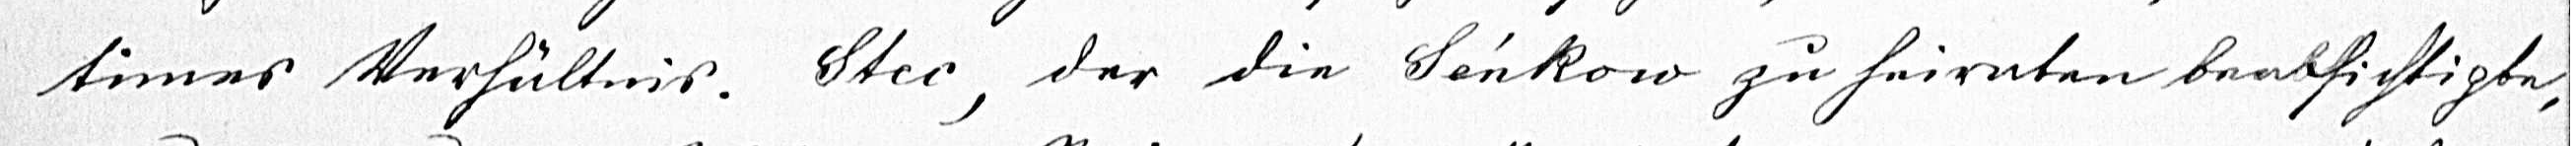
times Verhältnis. Stec, der die Seńków zu heiraten beabsichtigte,
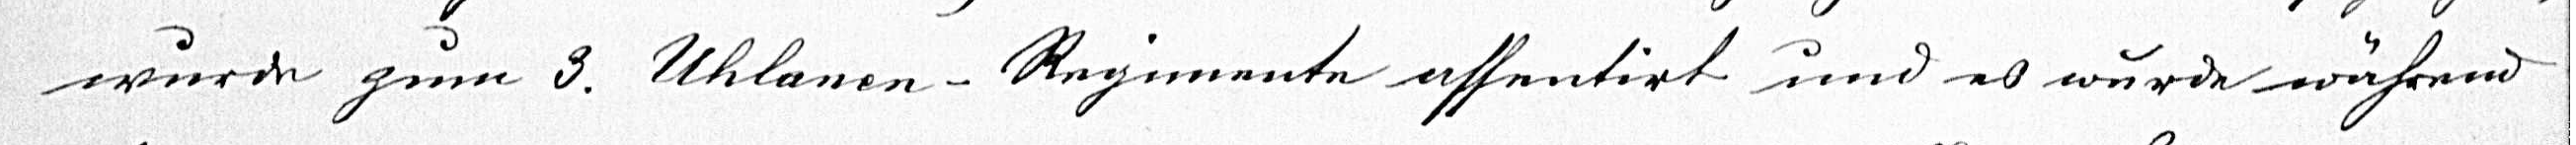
wurde zum 3. Uhlanen - Regimente assentiert und es wurde während
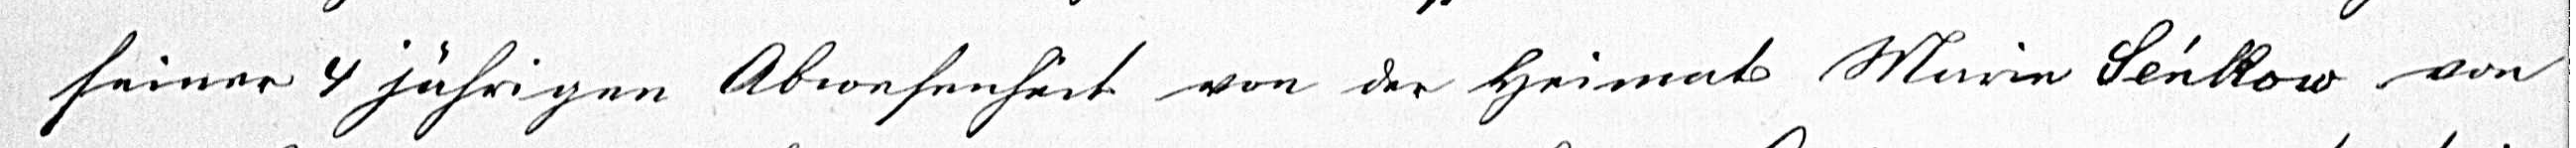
seiner 4 jährigen Abwesenheit von der Heimat Marie Seńków von
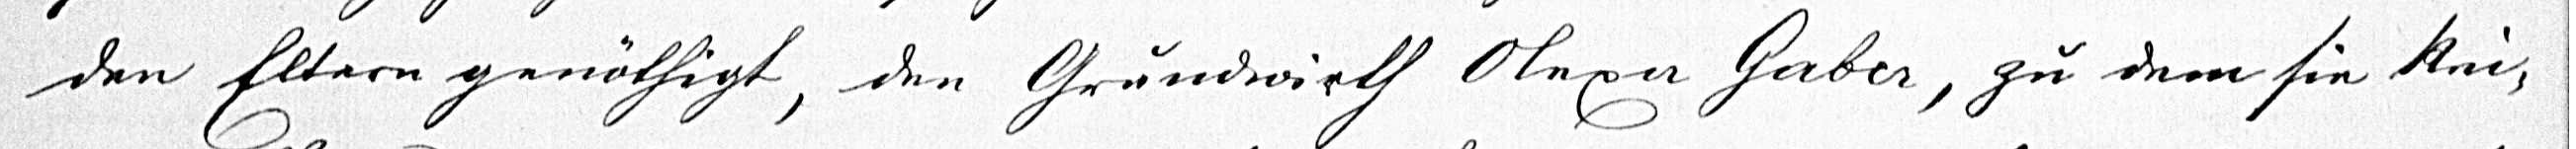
den Eltern genöthigt, den Grundwirth Olexa Gaber, zu dem sie kei¬
